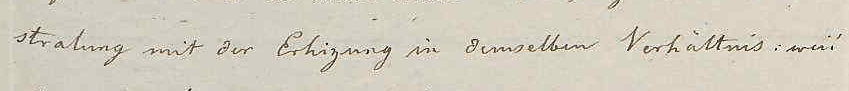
stralung mit der Erhizung in demselben Verhältnis: weil
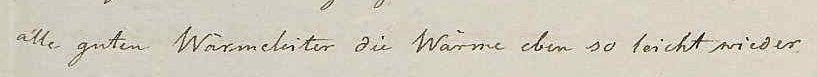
alle guten Wärmeleiter die Wärme eben so leicht wieder
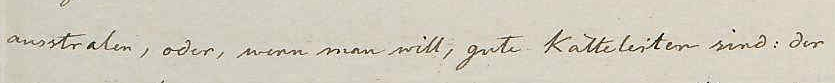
ausstralen, oder, wenn man will, gute Kälteleiter sind: der
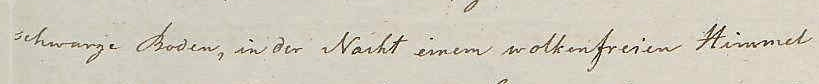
schwarze Boden, in der Nacht einem wolkenfreien Himmel
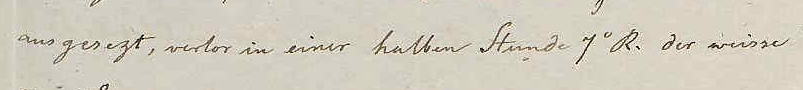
ausgesezt, verlor in einer halben Stunde 7° R. der weisse
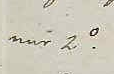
nur 2°.
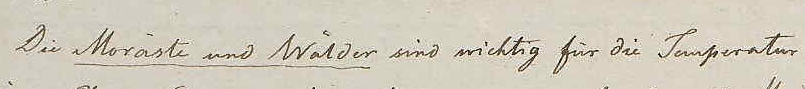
Die Moräste und Wälder sind wichtig für die Temperatur
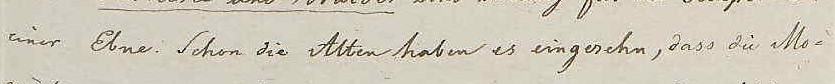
einer Ebne. Schon die Alten haben es eingesehn, dass die Mo-
